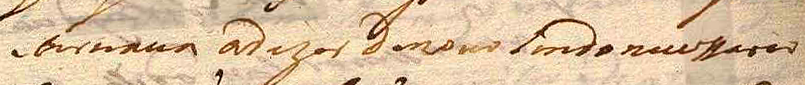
e tornaua a dizer de nouo sendo necessario
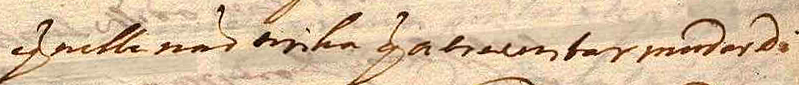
e q̄ nelle naõ tinha q̄ acrecentar mudar di
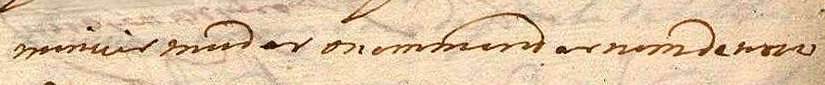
minuir mudar ou emmendar nem de nouo
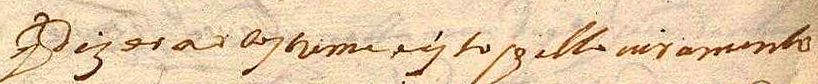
q̄ dizer ao costume e isto pello iuramento
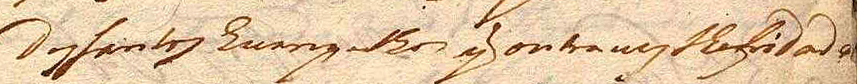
dos santos Euangelhos q̄ outra ues lhe foi dado
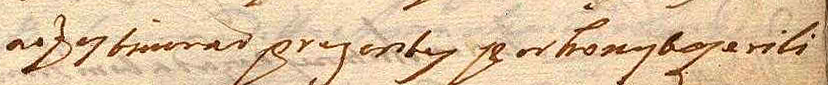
ao q̄ estiueraõ prezentes por honestas e rili
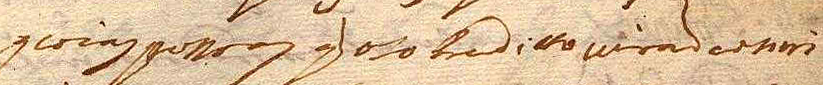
giozas pessoas q̄ o sobreditto uiraõ asina
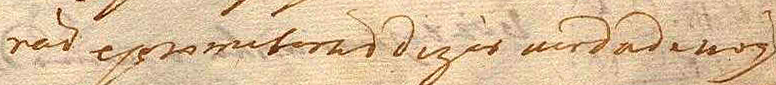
raõ e prometeraõ dizer uerdade no q̄
